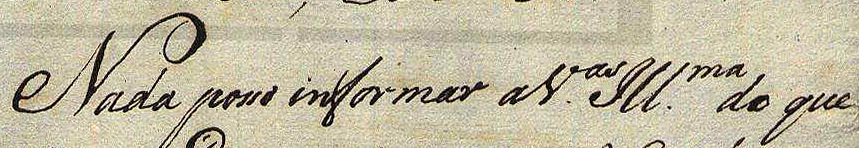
Nada posso informar a V.as Ill.ma do que
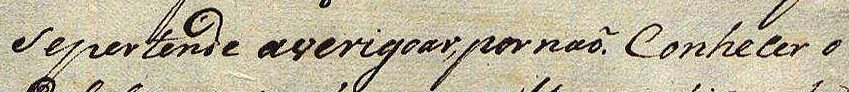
se pertende averigoar, por naõ. Conhecer o
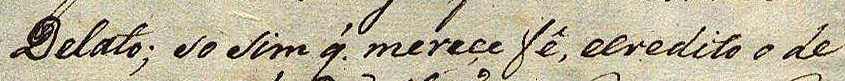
Delato; so sim q̄ merece fê, e credito o de
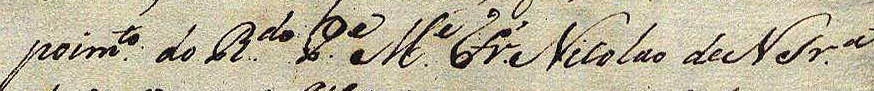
poim.to do R.do P.e M.e Fr̄. Nicolao de N Sr.a
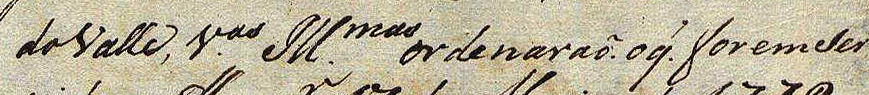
do Valle, V.as Ill.mas ordenaraõ o q̄ forem ser
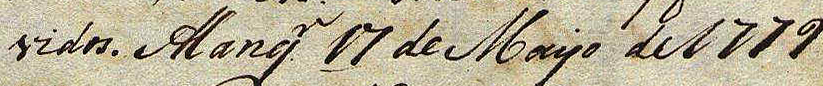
vidos. Alanq.r 17 de Mayo de 1779
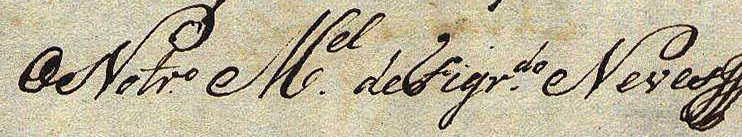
O Notr.o M.el de Figr.do Neves
